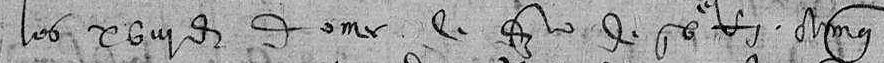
Aos xbiij di do mes de dzro de j̄bcRj. Annꝯ
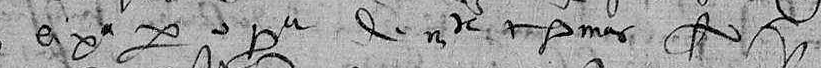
em lixa ꝑ o ꝓor de mte thomas foy
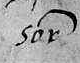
sor̄
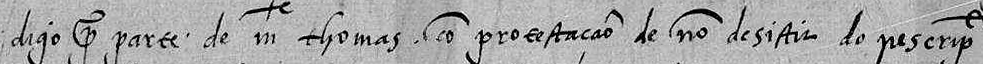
digo p̄o parte. de mte thomas c̄o protestação de n̄o desistir do rescripto
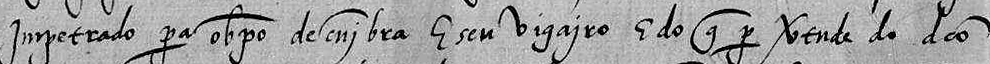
Jmpetrado ꝑa o b̄po de c̄ujbra E seu vigajro E do q̄ ꝑ ꝟtude do dcō
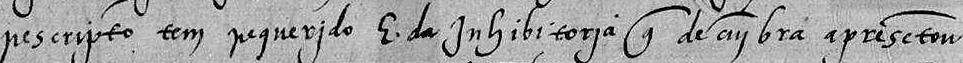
rescripto tem requerjdo E da Jnhibitorja q̄ de c̄ujbra apresētou
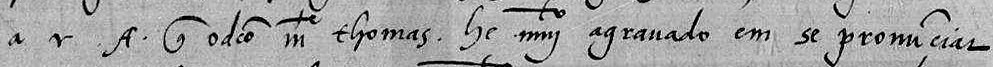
a v A. q̄ o dcō mte thomas he mujto agrauado em se pronūciar
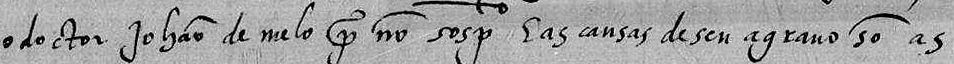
o doctor Johão de melo p̄o n̄o sospto E as causas de seu agrauo s̄o as
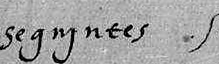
segujntes/
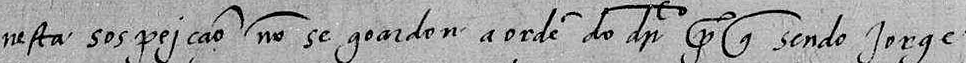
nesta sospeyção n̄o se goardou a ordē do drto p̄oq̄ sendo Jorge
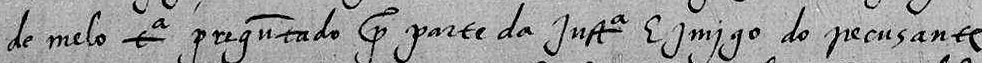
de melo ta pregūtado p̄o parte da Justa e Jmjgo do recusante
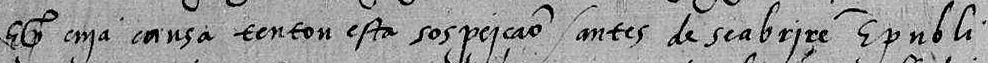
E p̄o cuja causa tentou esta sospejção / antes de se abrjrē E publi
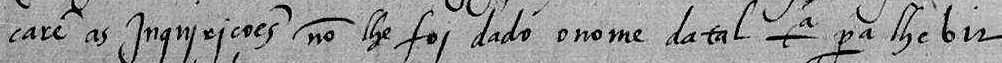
carē as Jnqujrjções n̄o lhe foj dado o nome da tal ta ꝑa lhe vir
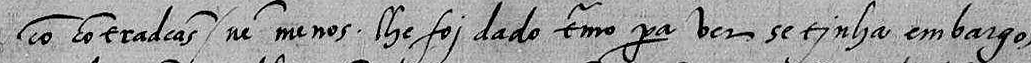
c̄o cōtradcas̄ / nē menos. lhe foj dado t̄mo ꝑa ver se tjnha embargos
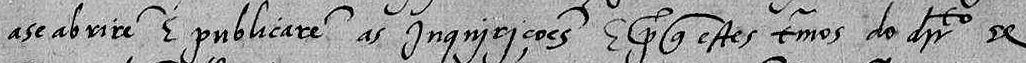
a se abrirē E publicarē as Jnqujrjções e p̄oq̄ estes tm̄os do dirto se
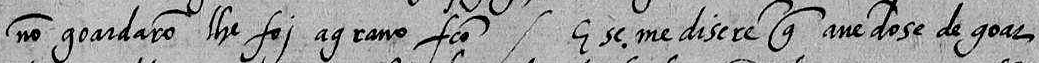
n̄o goardarō lhe foj agrauo fcō / E se me diserē q̄ auēdose de goar
